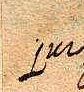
jur
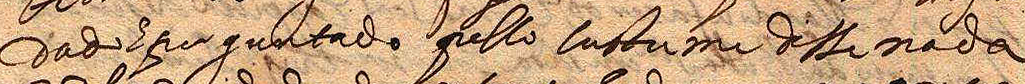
dado E perguntado pello custume disse nada
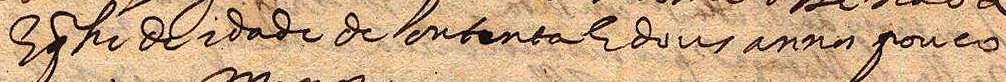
E q̄ he de idade de outenta E dous annos pouco
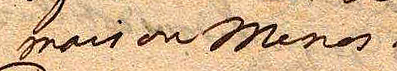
mais ou menos.
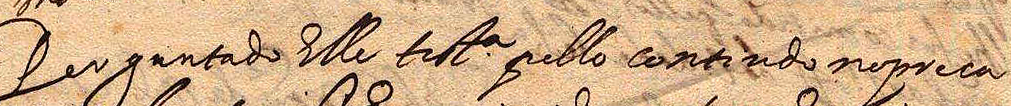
Perguntado Elle test.a pello conteudo no preca
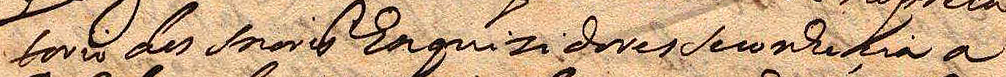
torio dos snores̄ Enquizidores se conhecia a
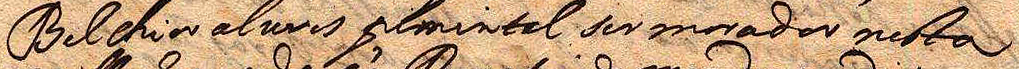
Belchior alures pimintel ser morador nesta
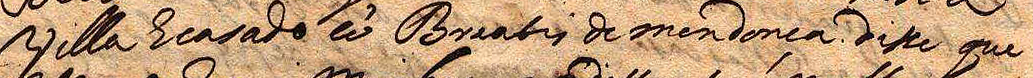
Villa E casado cō Briatis de mendonça disse que
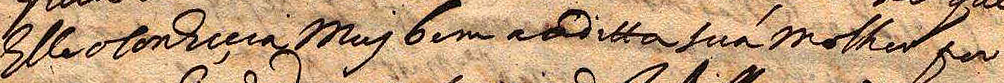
Elle o conhecia muj bem a a ditta sua molher por
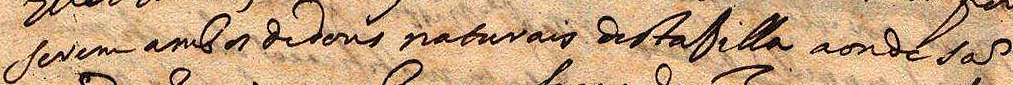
serem ambos de dous naturais desta Villa aonde saõ
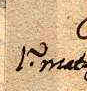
1.o mat.
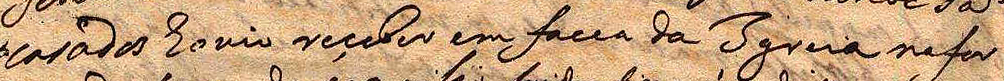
casados E o uio receber em facea da Igreia na for
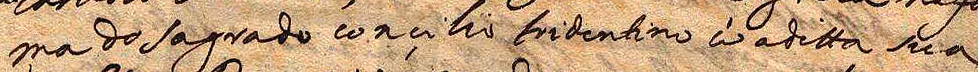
ma do sagrado concilio tridentino cō a ditta sua
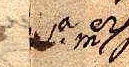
1.a m.er
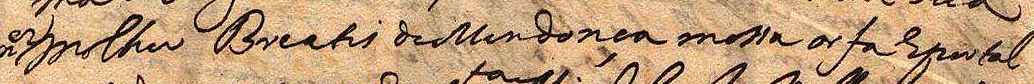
molher Breatis de Mendonça mossa orfa E por tal
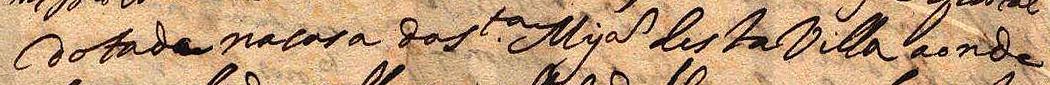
dotada na casa da s.ta Mya desta Villa aonde
